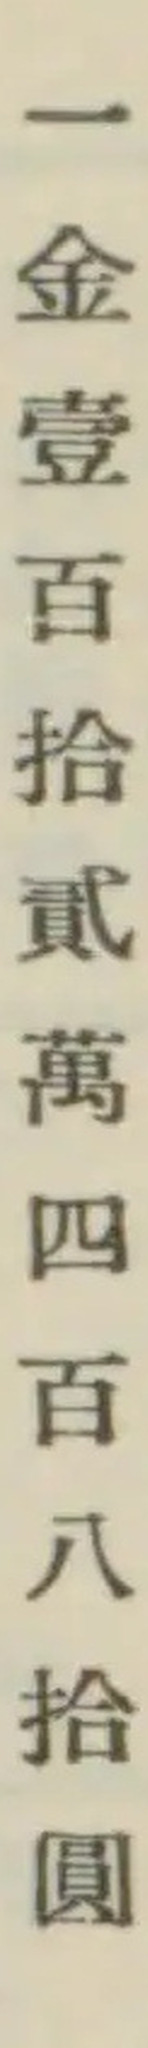一金壹百拾貳萬四百八拾圓
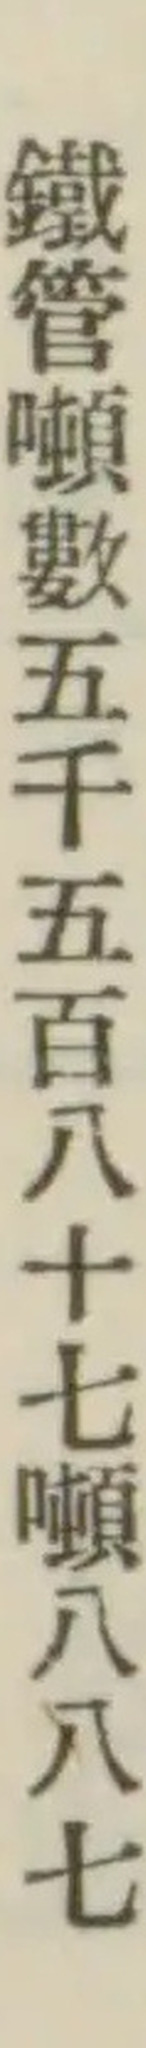鐵管噸数五千五百八十七噸八八七

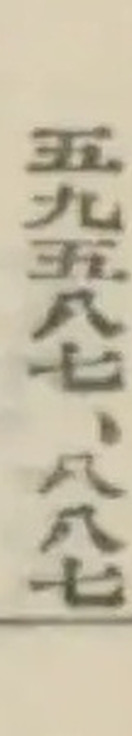計五九五八七、八八七
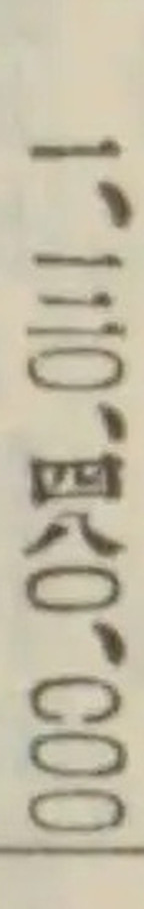合計一一二〇、四八〇、〇〇〇
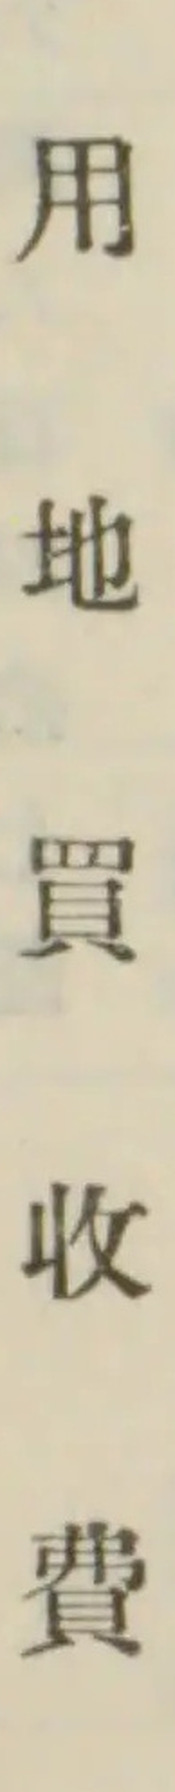用地買収費
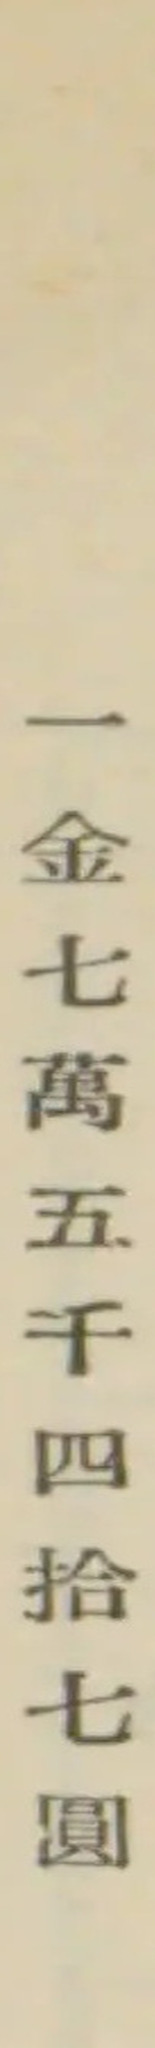一金七萬五千四拾七圓
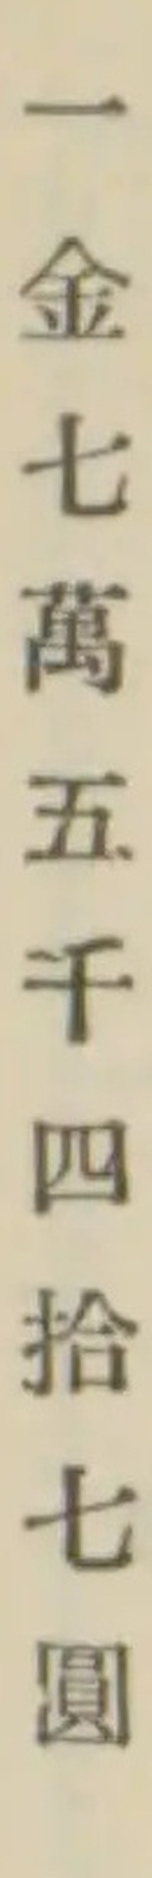一金七萬五千四拾七圓

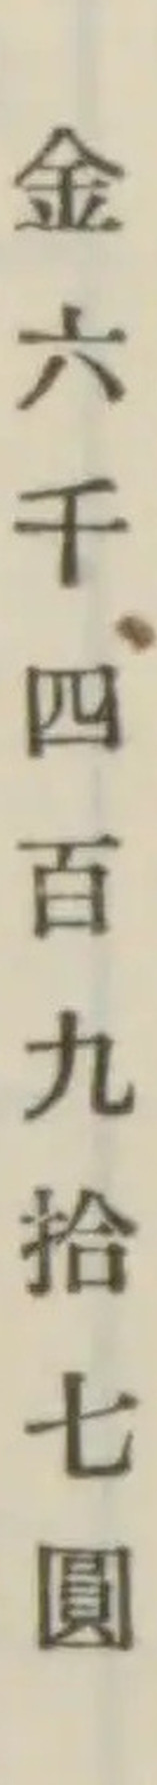一金六千四百九拾七圓
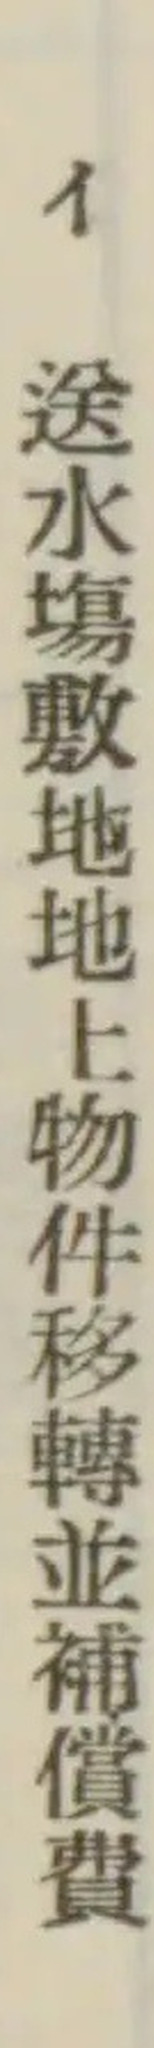イ送水場敷地地上物件移轉並補償費
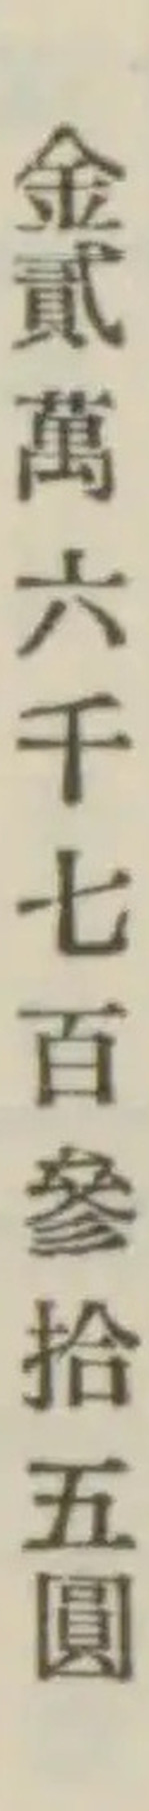一金貳萬六千七百參拾五圓
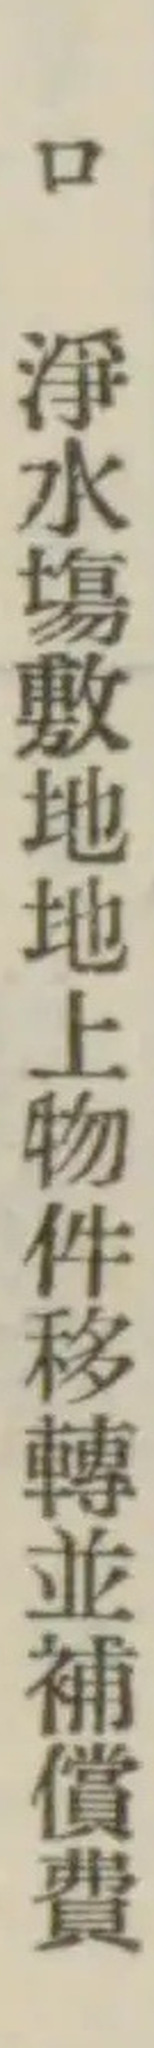(ロ)浄水場敷地地上物件移轉並補償費
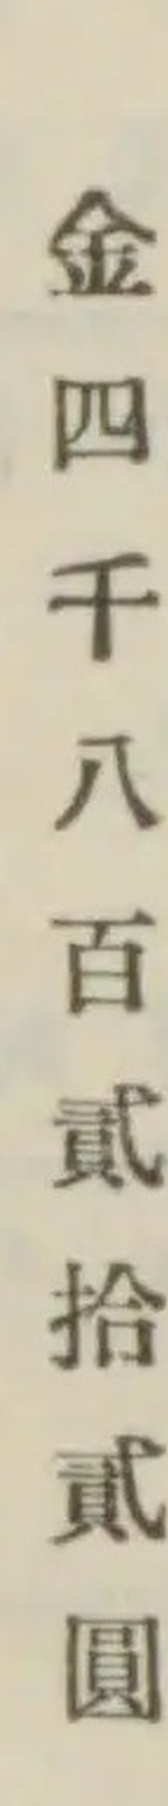一金六千四百九拾七圓
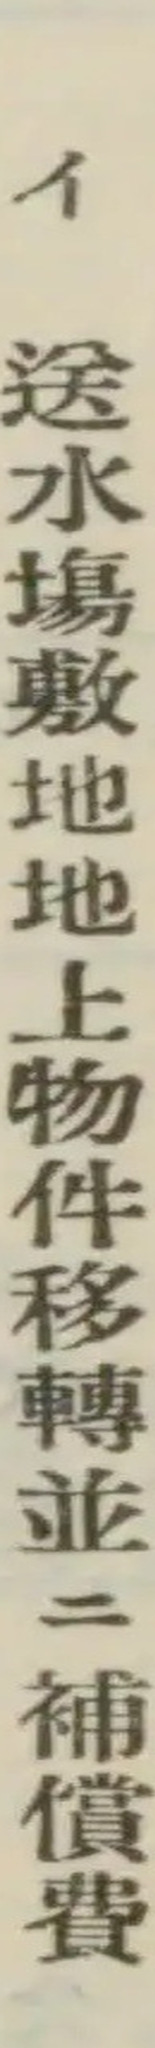イ送水場敷地地上物件移轉並補償費
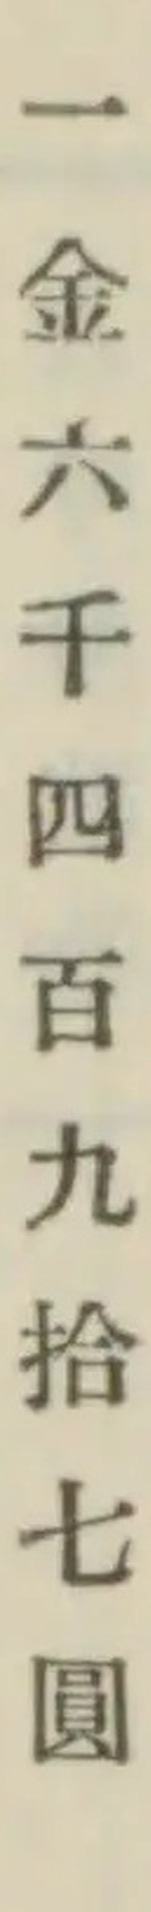一金六千四百九拾七圓
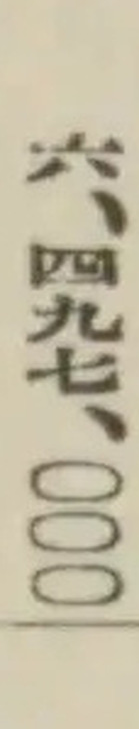計六、四九七、〇〇〇
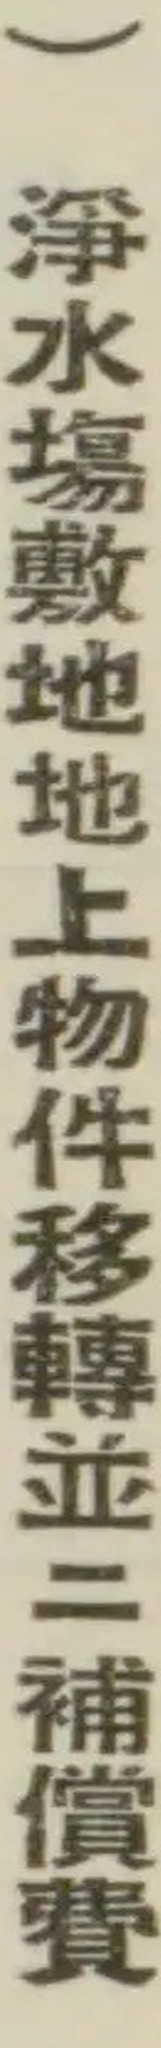イ送水場敷地地上物件移轉並補償費
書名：豊橋市水道誌
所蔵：国立国会図書館 National Diet Library, JAPAN
